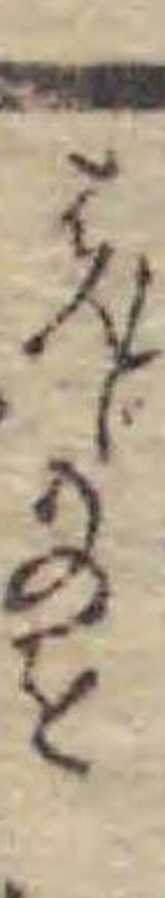はんじものを
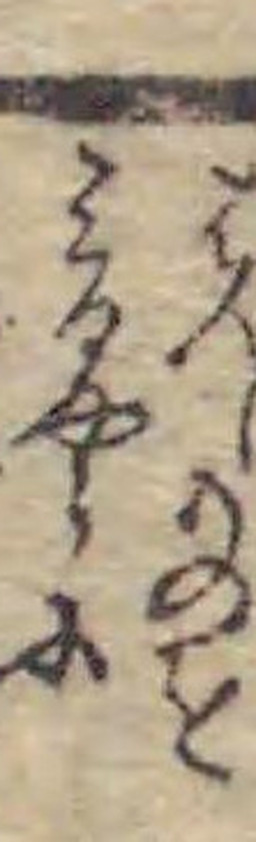みるやうに
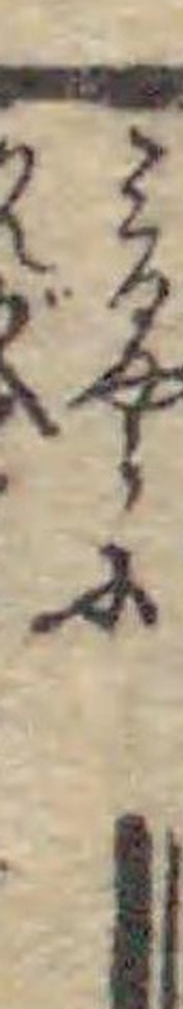みるやうに
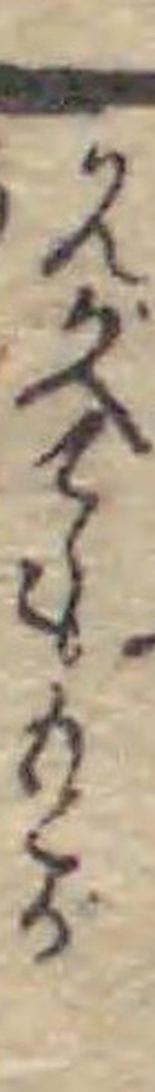かんがへてももしが
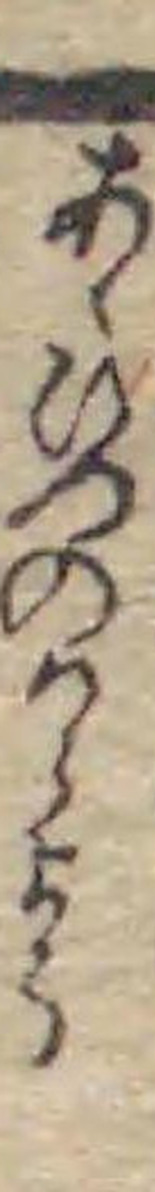あくひつのからよう
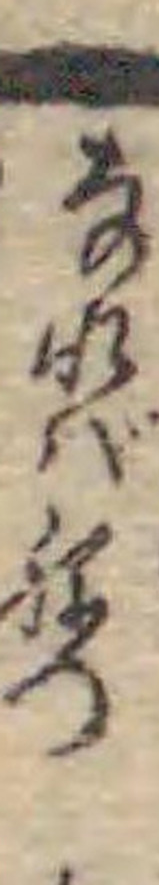なればねつ
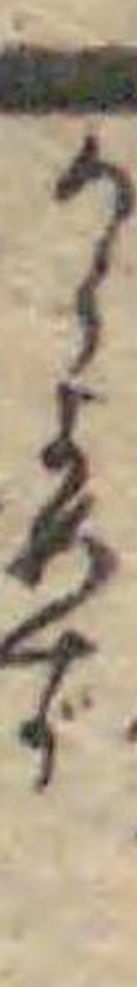からよめず
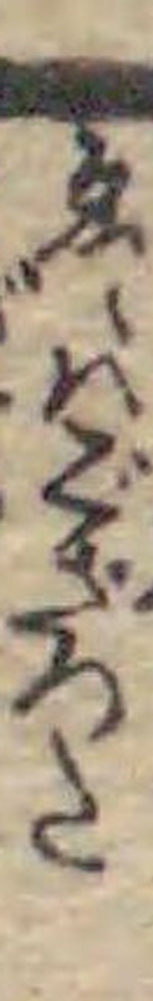ゑゝはござつた
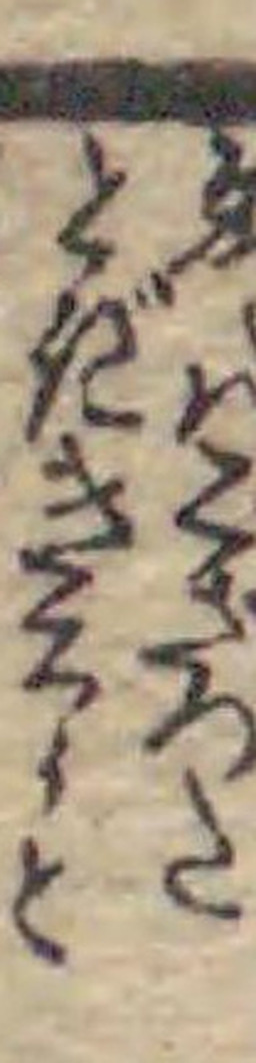とぎきこうと
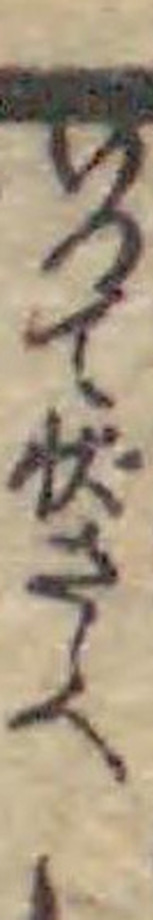いつて状さしへ
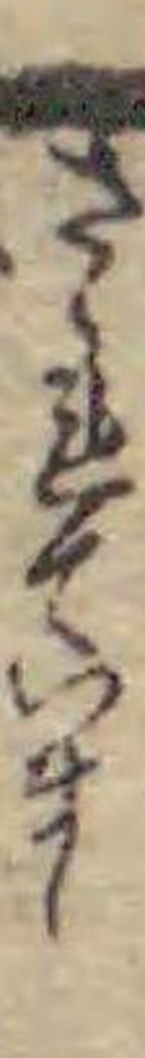さゝれていまし
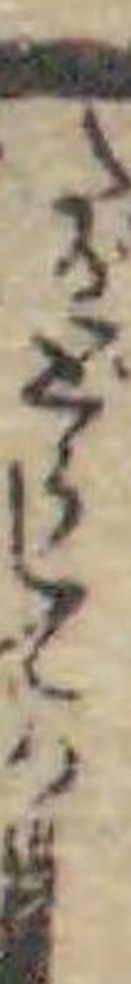たがどうしてか
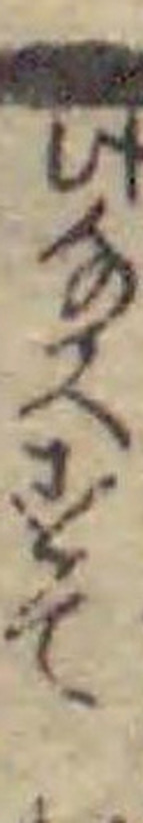此なかへすて
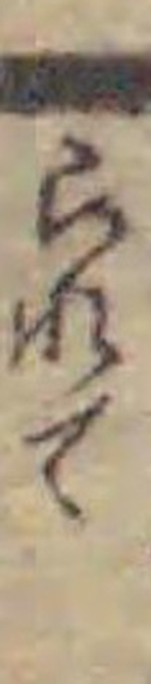られて
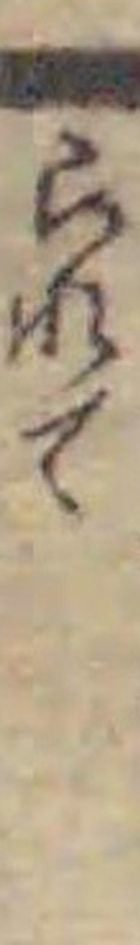られて
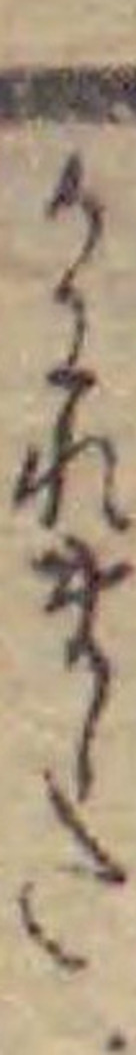かわれました
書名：紙屑身上噺 : 3巻
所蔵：国立国会図書館 National Diet Library, JAPAN
